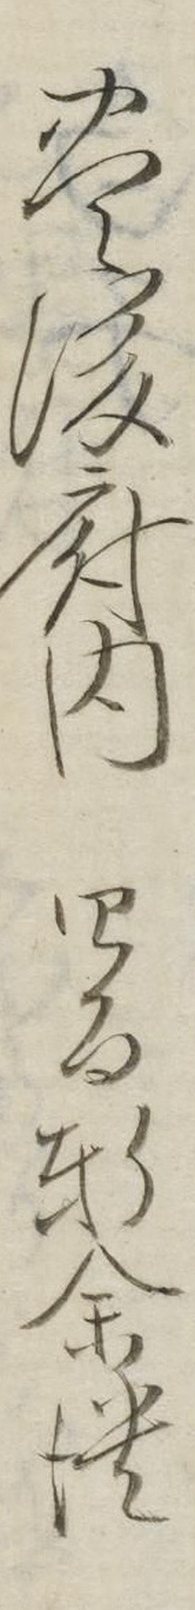豊後府内四百軒余潰
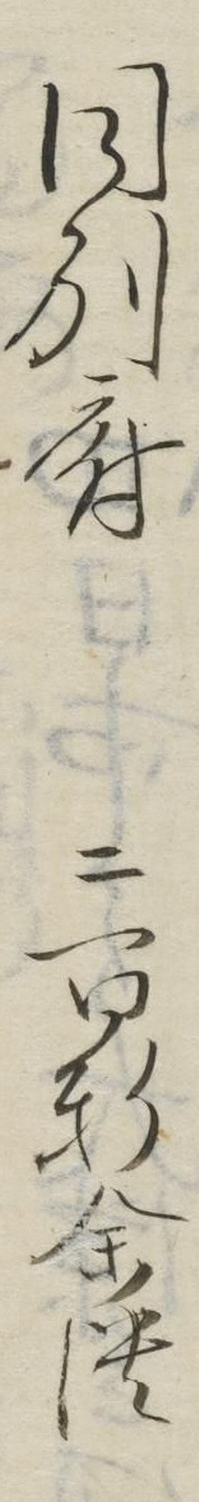同別府二百軒余潰
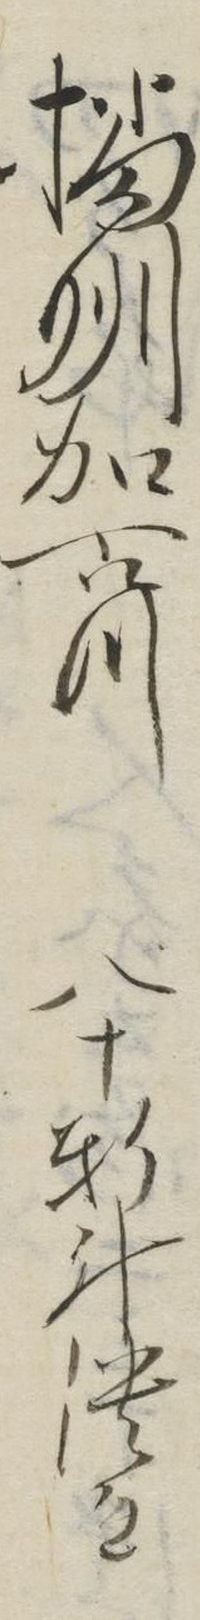播州加古川八十軒計潰れ
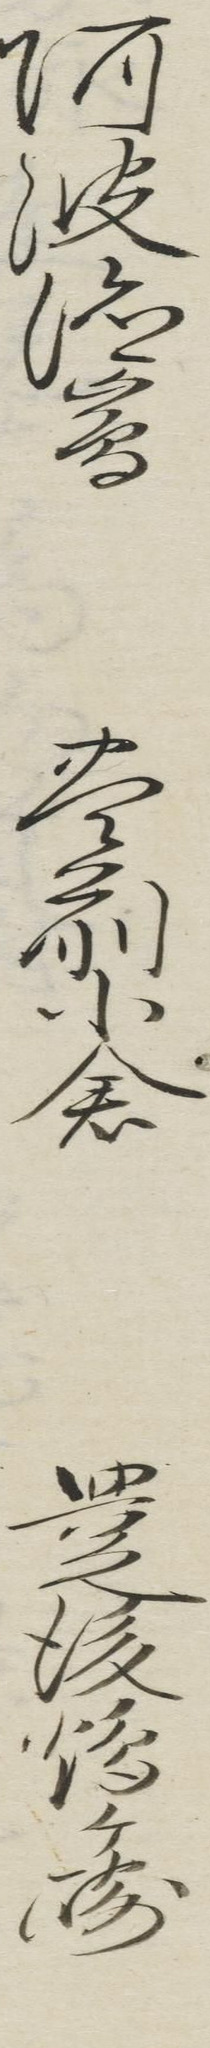阿波徳嶌豊前小倉豊後鶴ケ崎
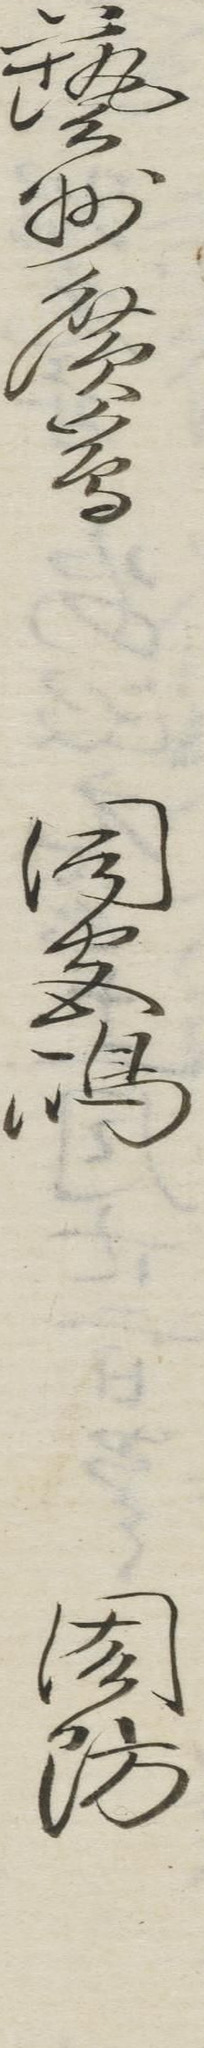芸州廣嶌同宮嶌周防
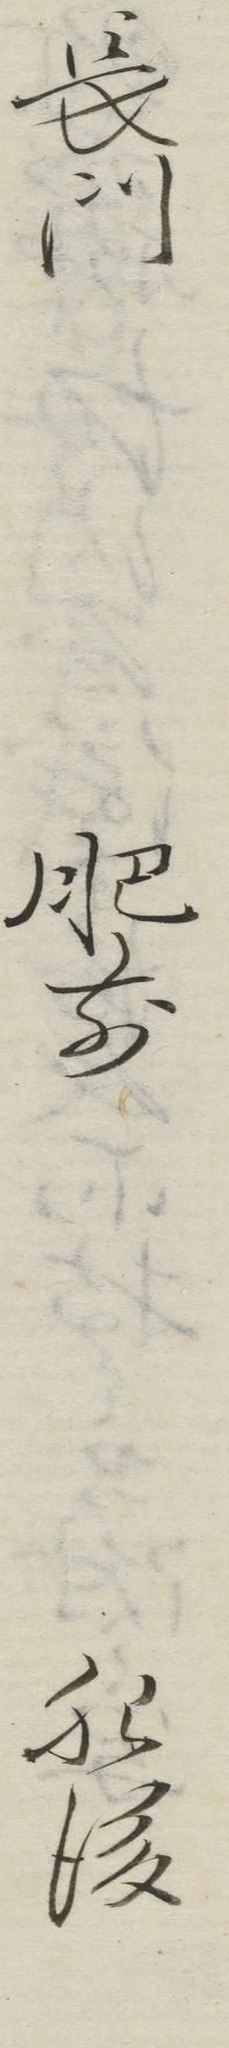長門肥前肥後
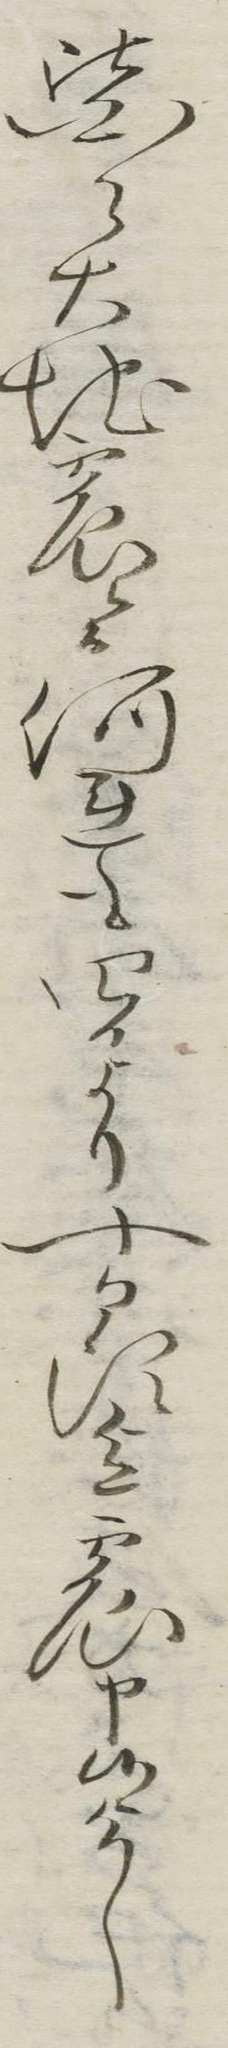皆〻大地震ニ而何れも四日より十日頃迄震申候よし
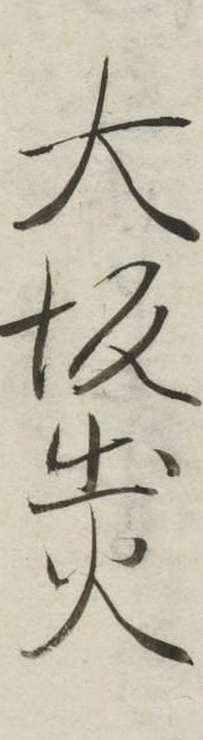大坂出火
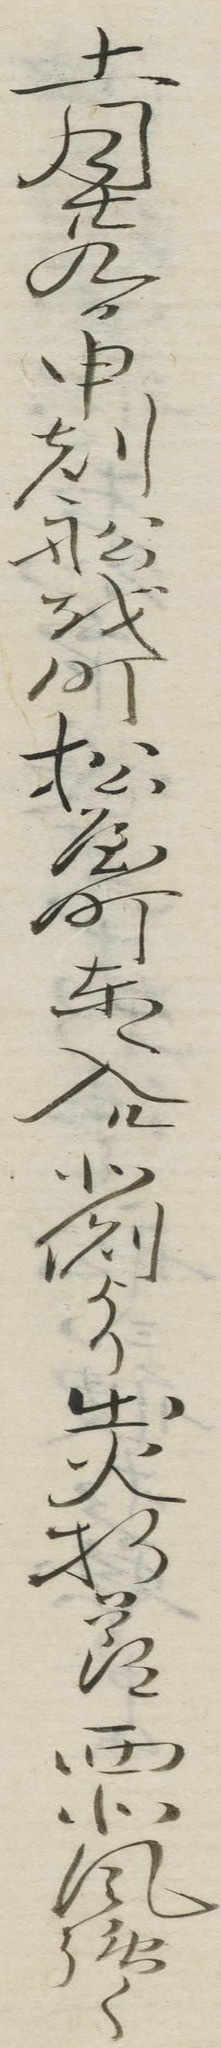十一月廿九日申刻船越町松屋町東へ入ル北側より出火折節西北風強く
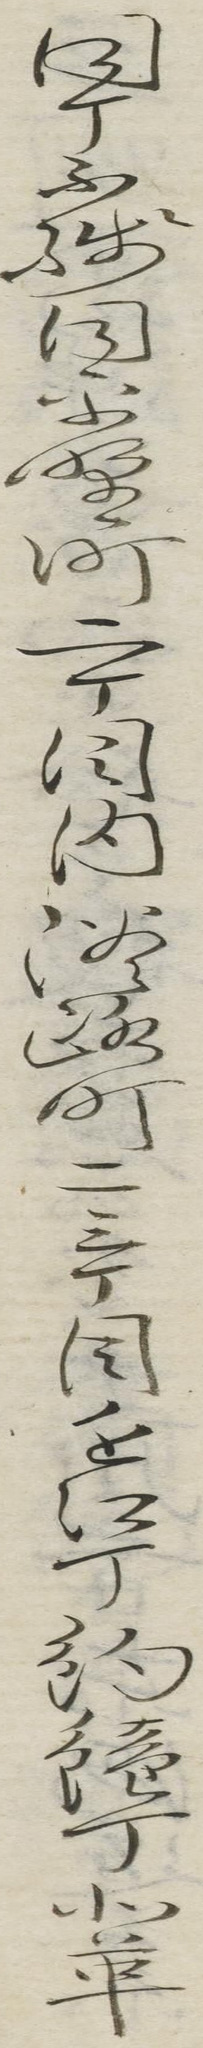同丁不残同平野町二丁目内淡路町二三丁目近江丁釣鐘丁北革
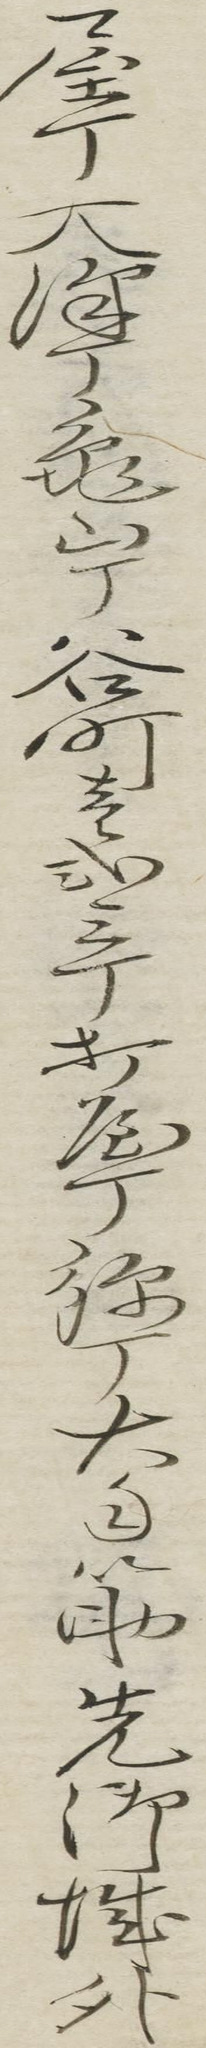屋丁大澤丁亀山丁谷町壱弐三丁打屋丁綿丁大手先御城外
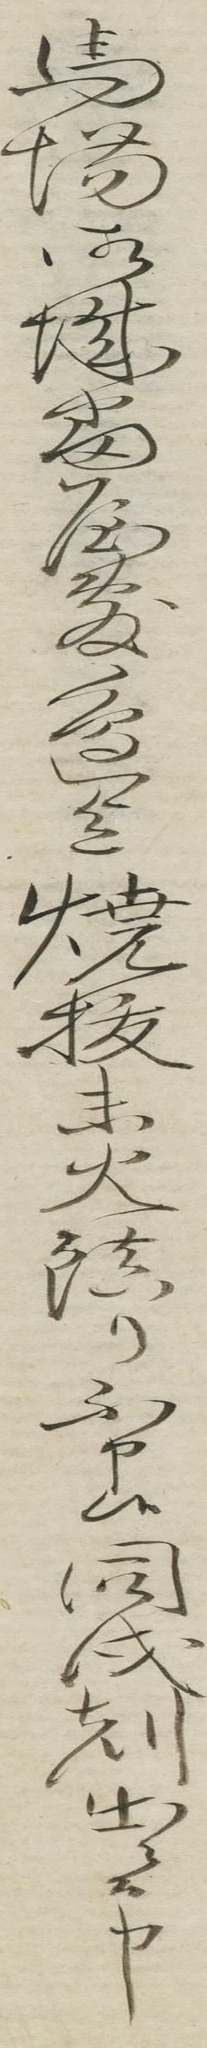馬場御城番屋敷辺迄焼抜未火鎮り不申候同戌刻出ニ而申

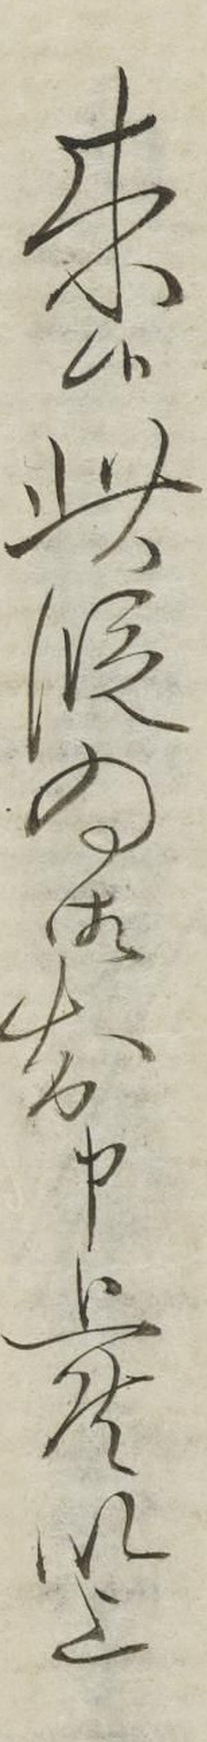来候此段為御知申上候以上
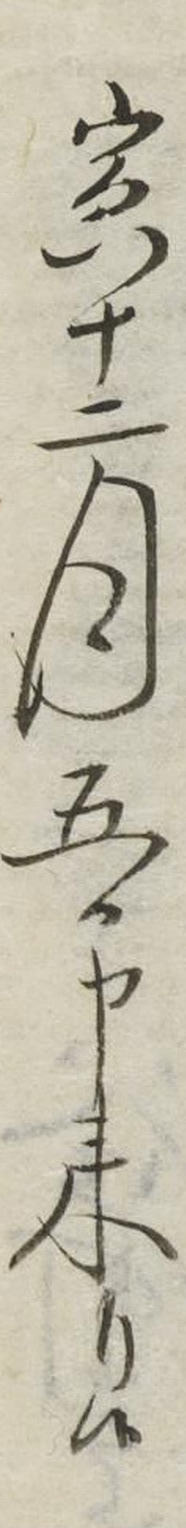寅十二月五日申来り候
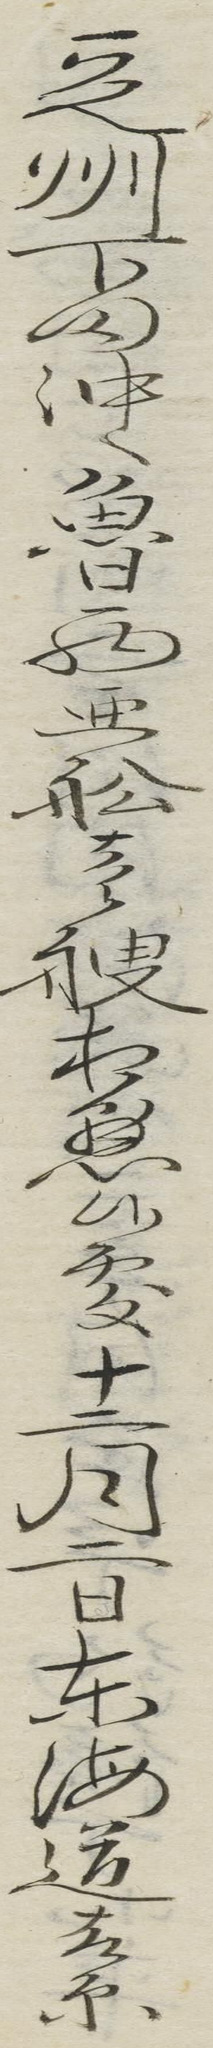豆州下田沖へ魯西亜船壱艘相懸候処十二月二日東海道吉原
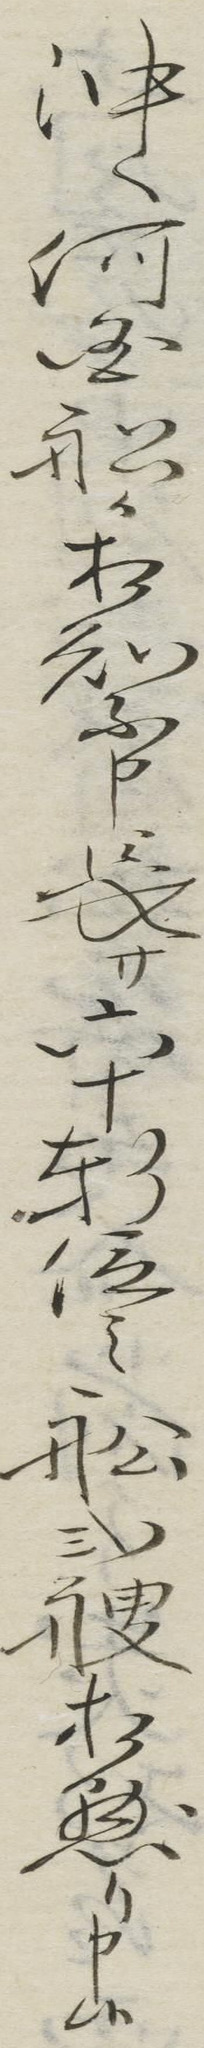沖へ何国船か相知不申長サ六十軒位之船二艘相懸り申候
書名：大地震實録
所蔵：東京大学地震研究所図書室 Earthquake Research Institute Library, The University of Tokyo, JAPAN
